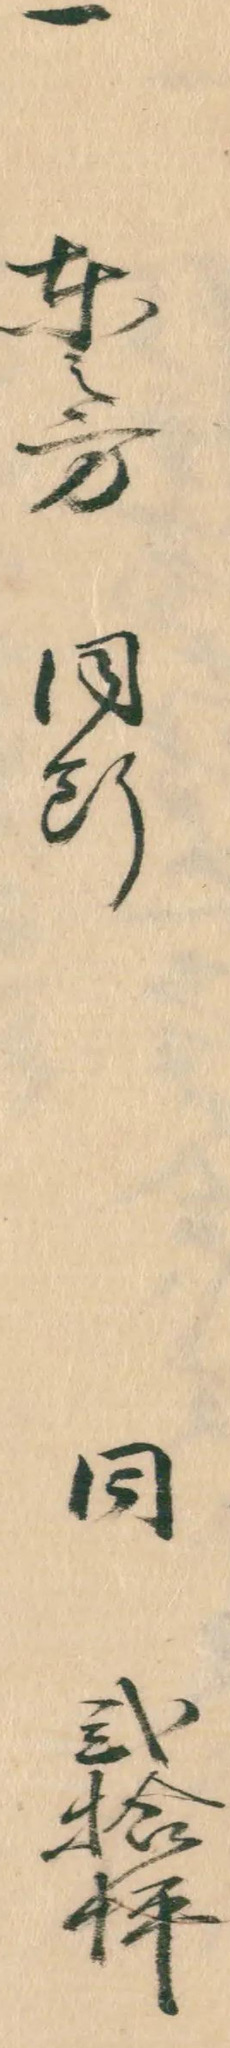一東之方同断同弐拾坪
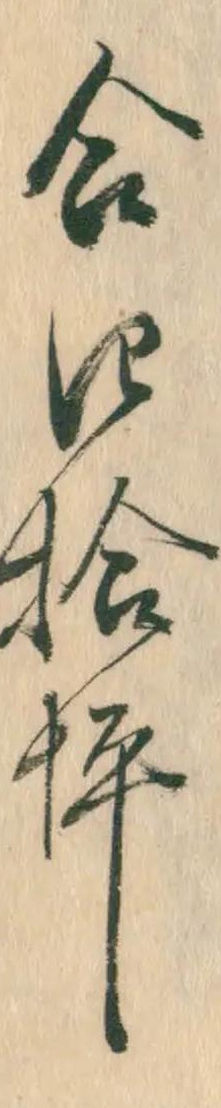合四拾坪
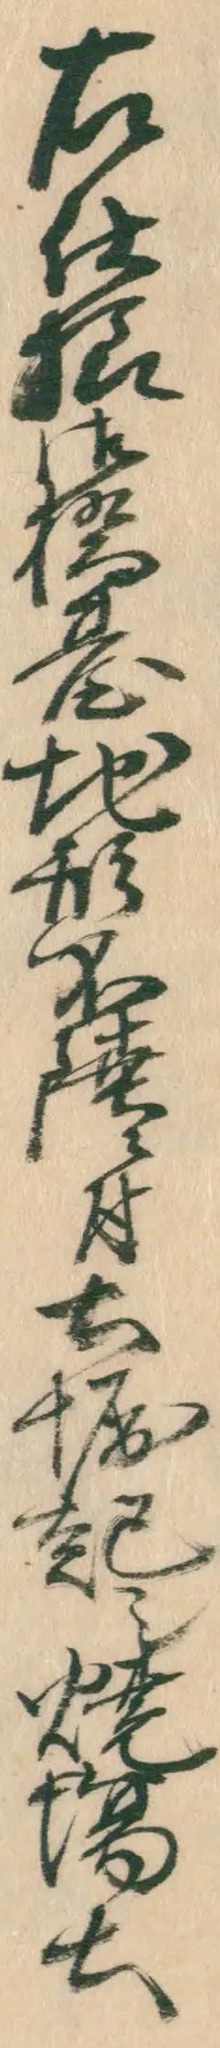右仕様御橋台地形不陸ニ付土掘起シ焼場土
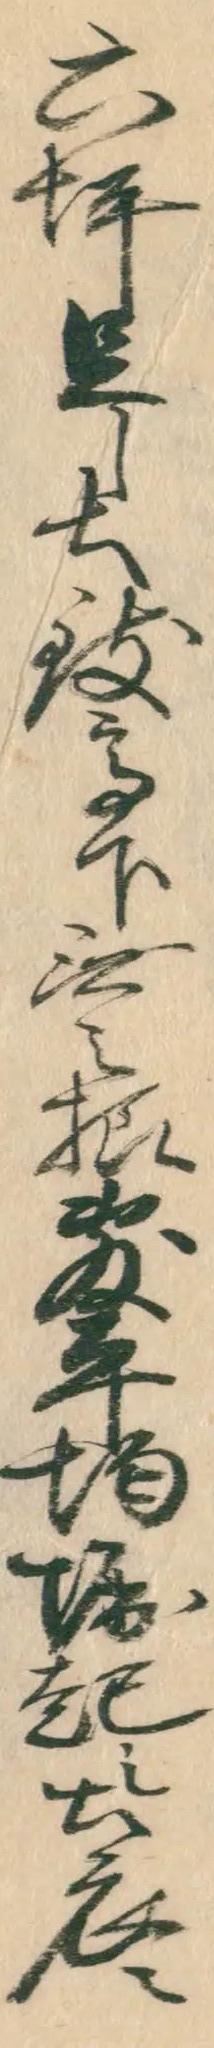六坪足し土致高下無之様敷平均堀起シ土衣ニ
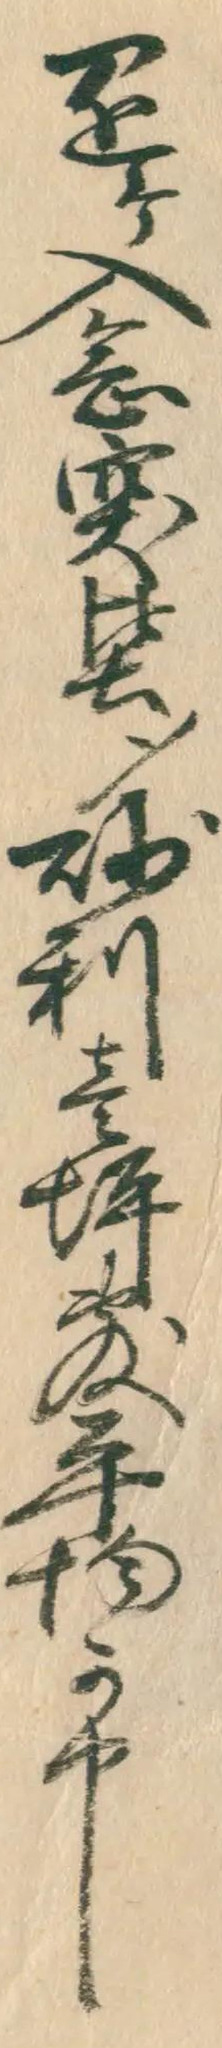懸ケ入念突堅メ砂利壱坪敷平均可申

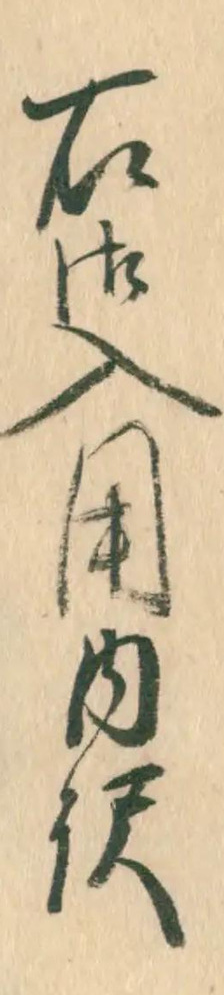右御入用内訳
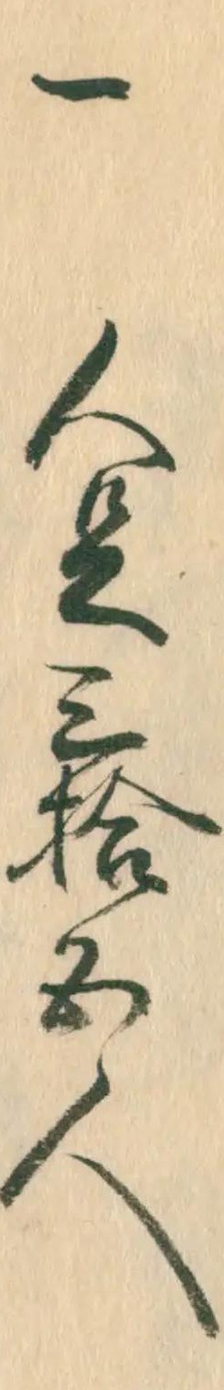一人足三拾五人
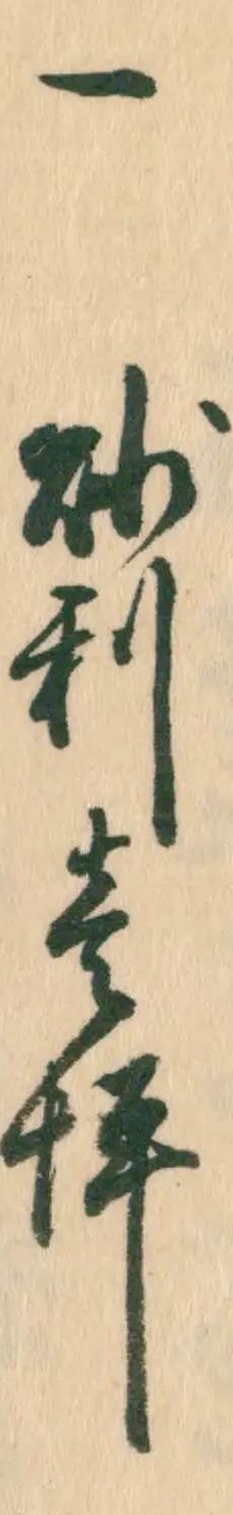一砂利壱坪
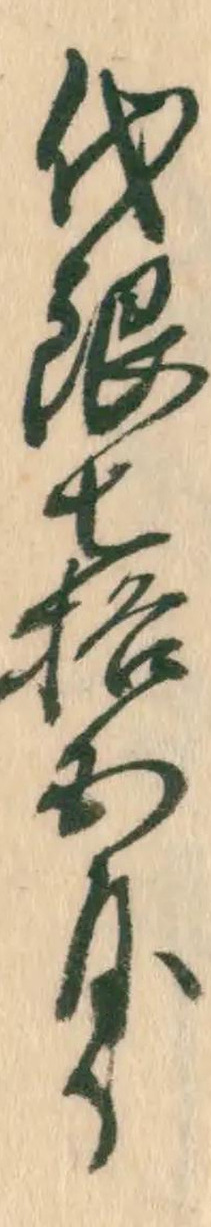代銀百五匁但壱人銀三匁
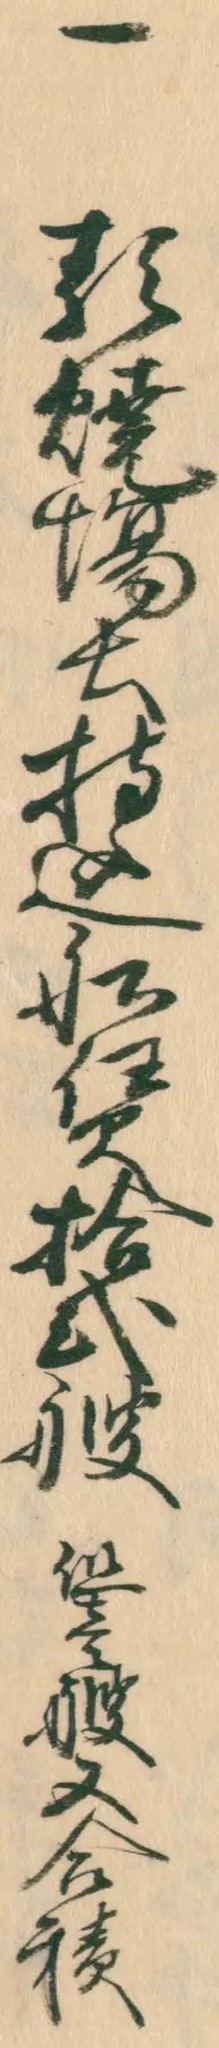一類焼場土持込船賃拾弐艘但壱艘五合積
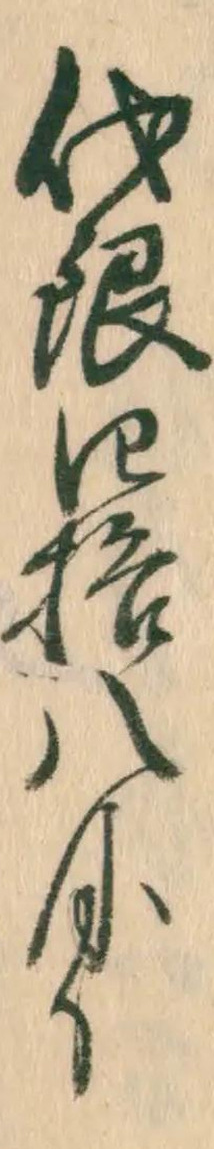代銀七拾五匁
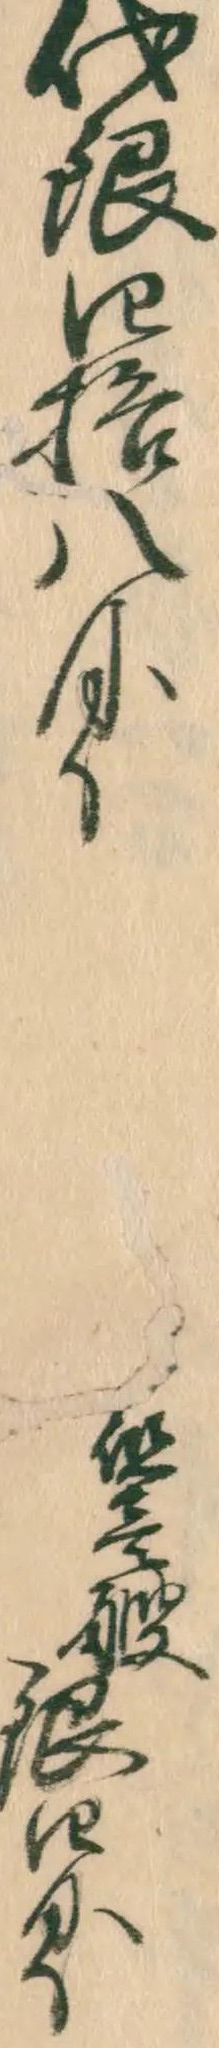代銀四拾八匁但壱艘銀四匁
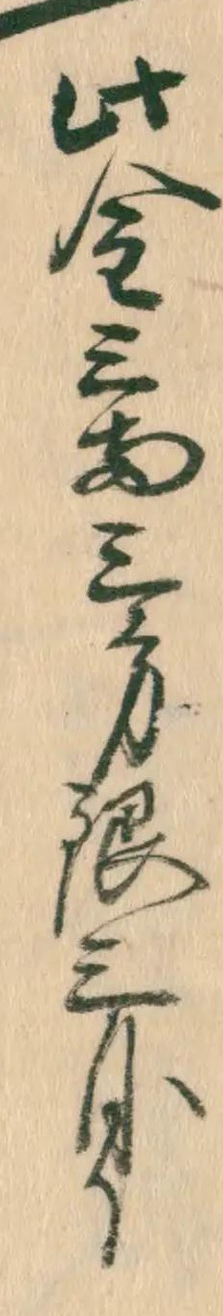此金三両三分銀三匁
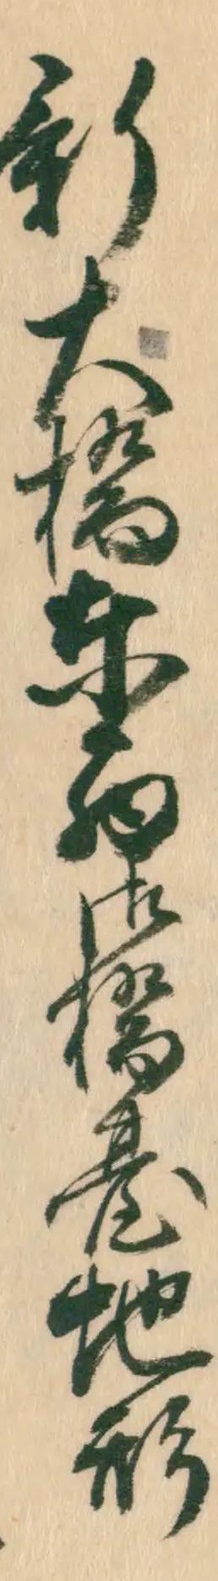新大橋東西御橋台地形
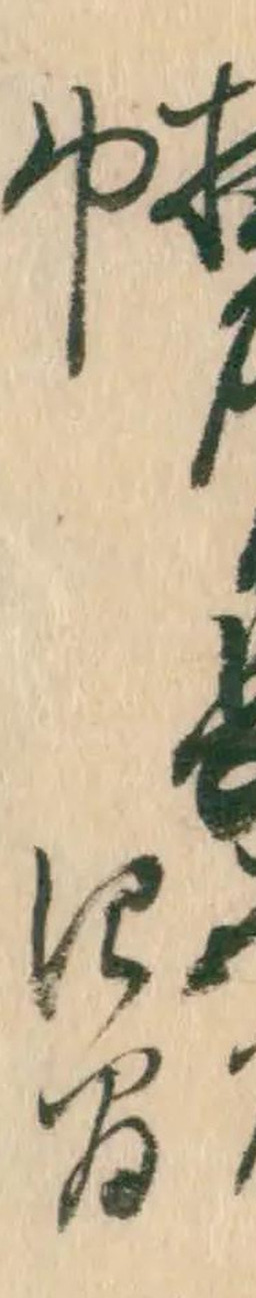巾四間
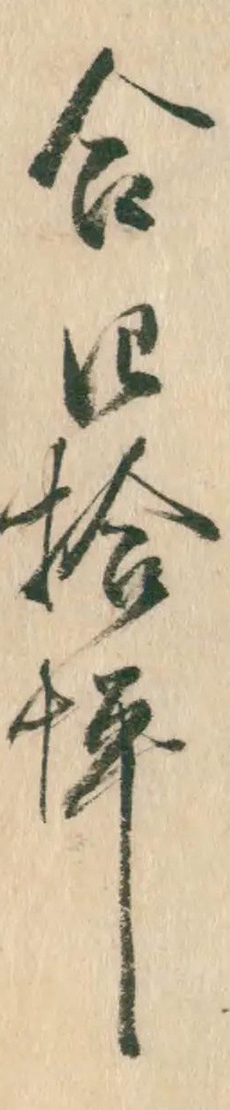合四拾坪
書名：三橋 17巻. [8] 三橋小破御修復書留　但御奉行御掛リ替地震潰橋番屋　嘉永四亥年より安政二卯年迄　下
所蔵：国立国会図書館 National Diet Library, JAPAN
